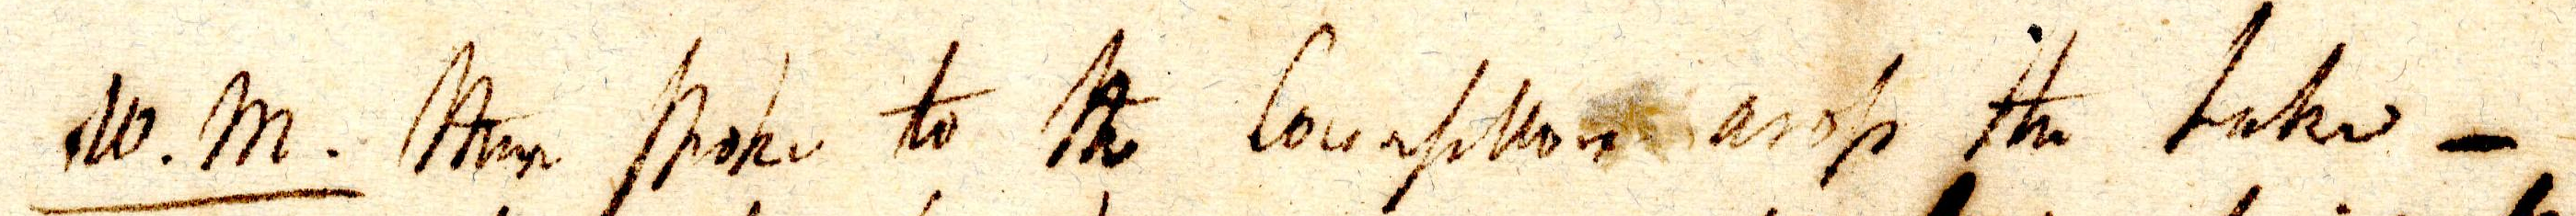W. M. then spoke to the Counsellor across the Lake-
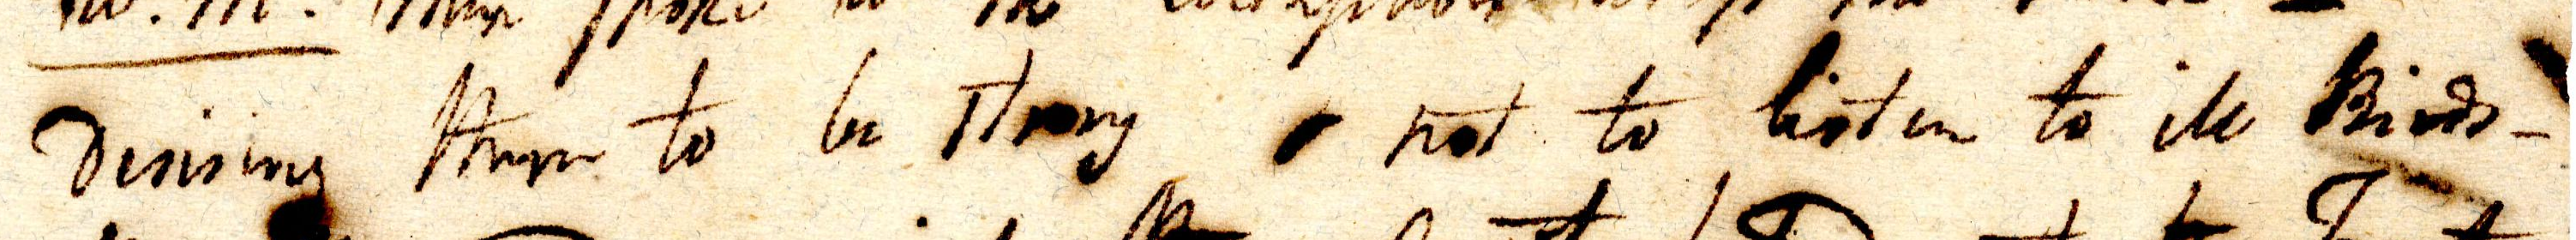desiring them to be strong & not to listen to ill Birds-
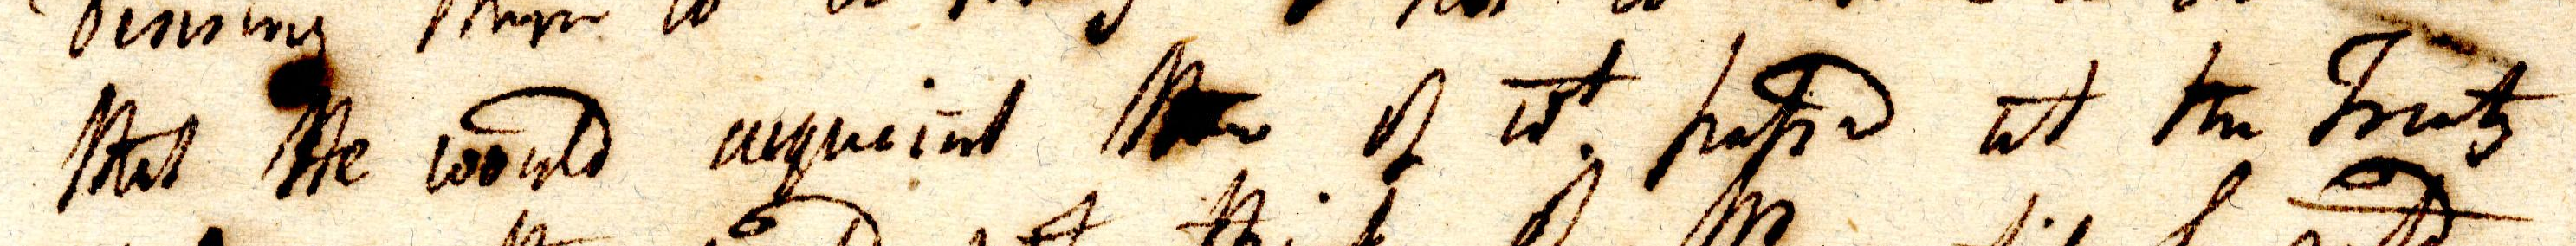that He would acquaint them of w^t passed at the Treaty
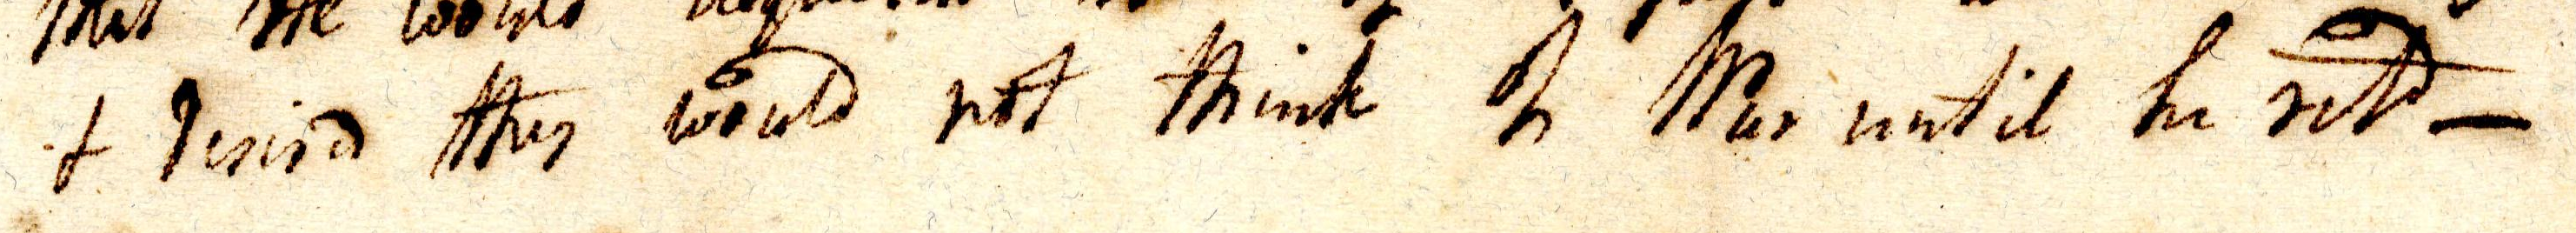& desired they would not think of War until he ret^d-
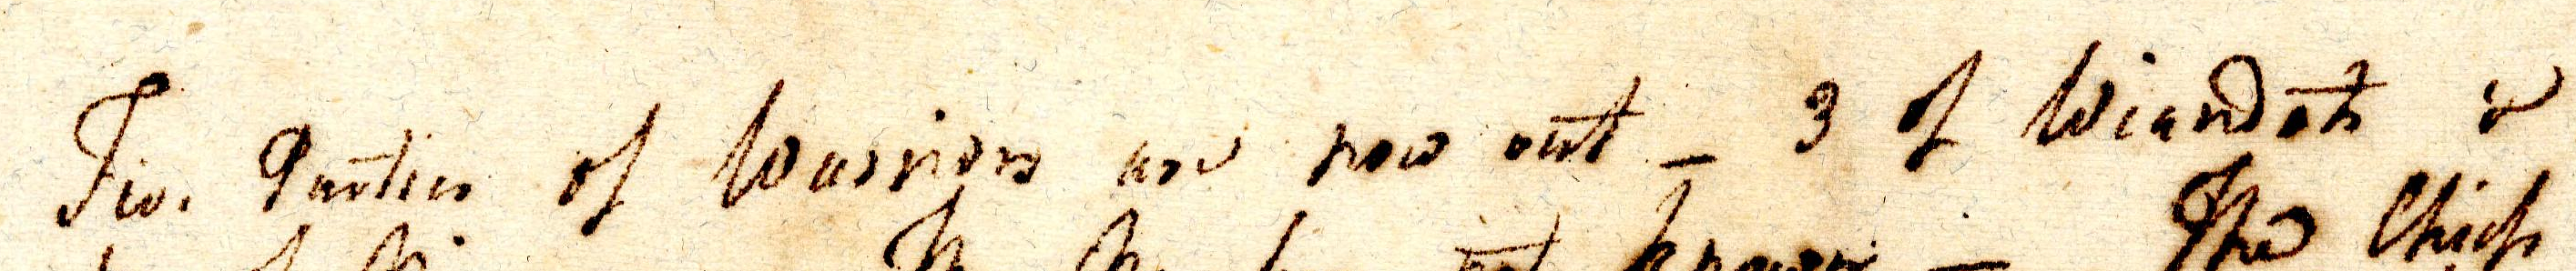Five Parties of Warriors are now out- 3 of Wiandots &
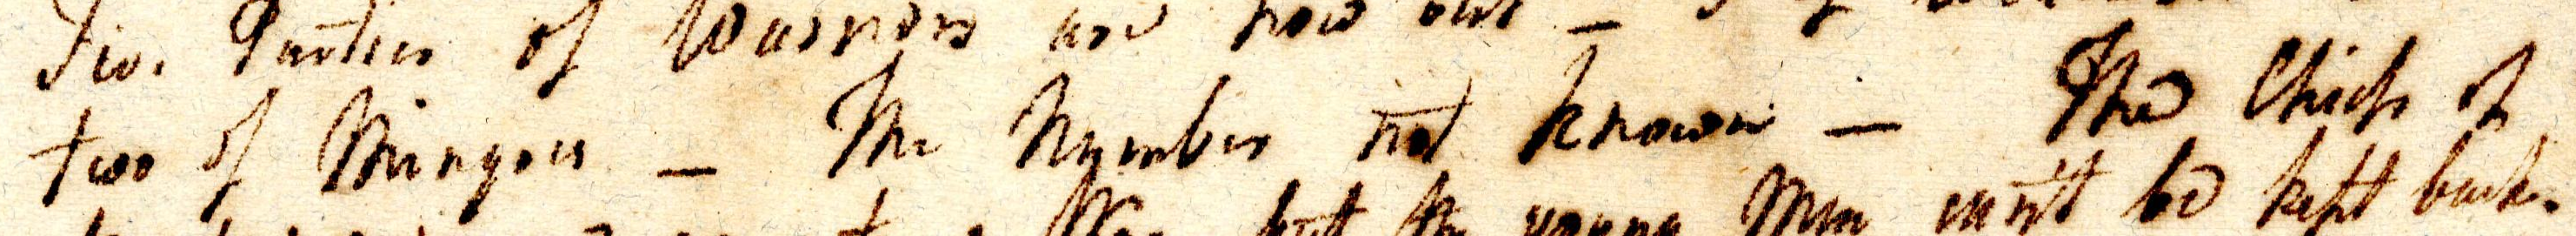two of Mingoes- The Numbers not known- The Chiefs of
